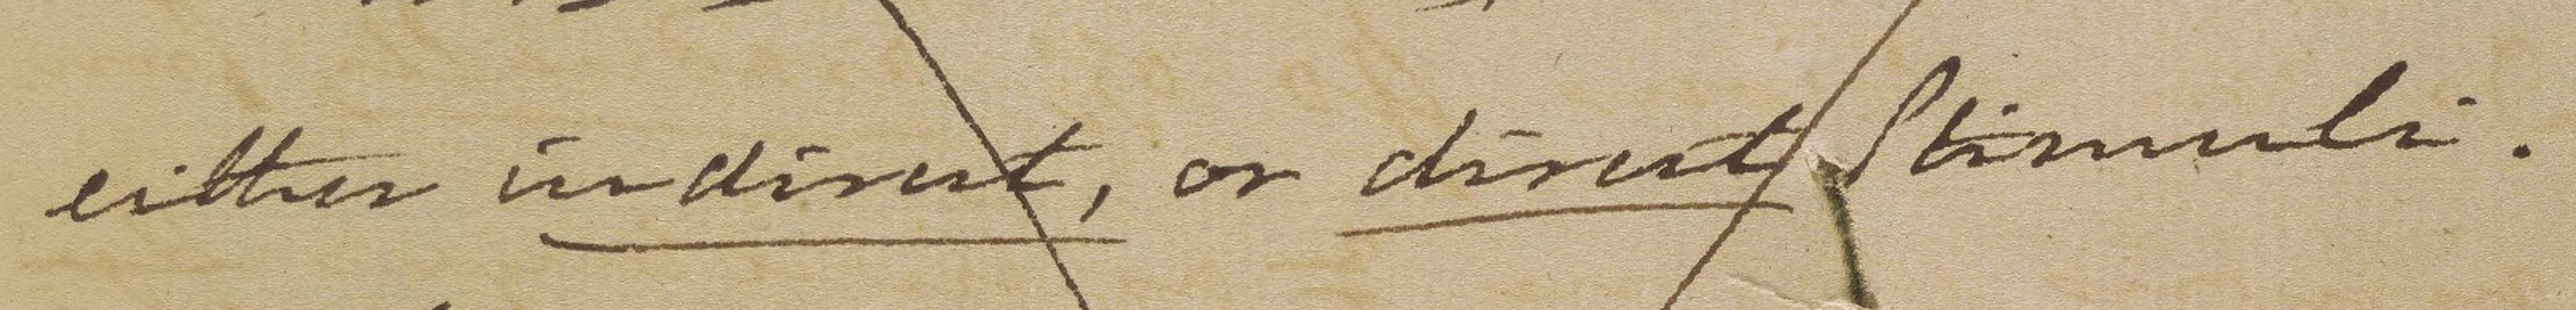either indirect, or direct stimuli.
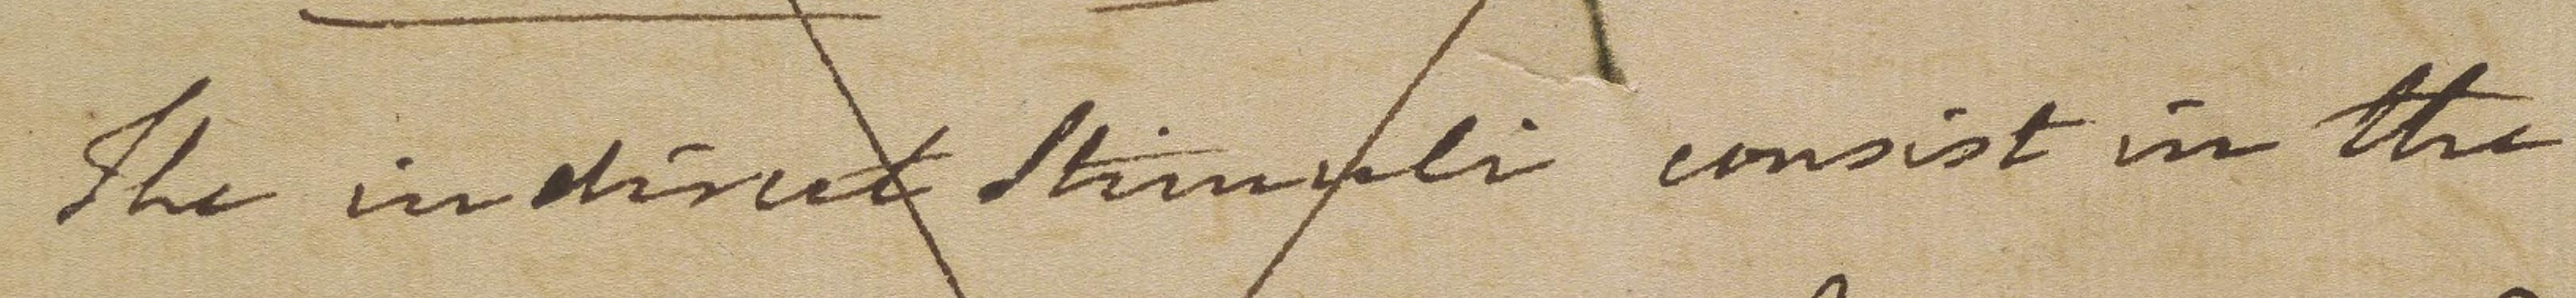The indirect Stimuli consist in the
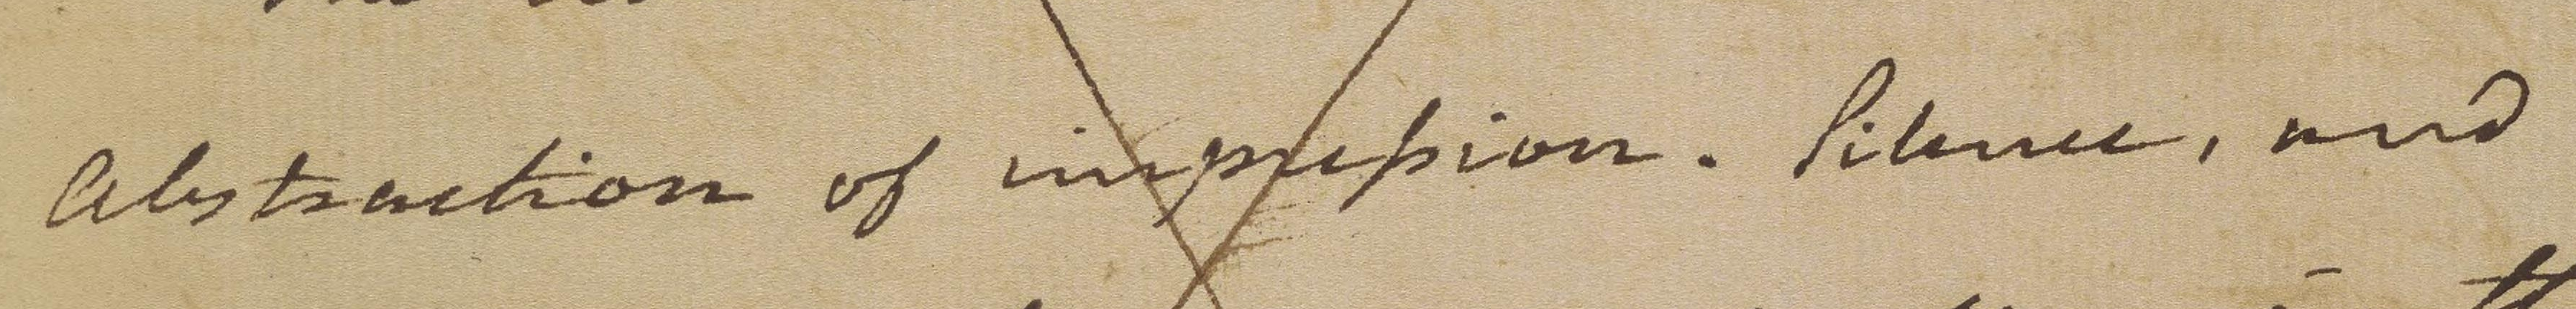Abstraction of impression. Silence, and
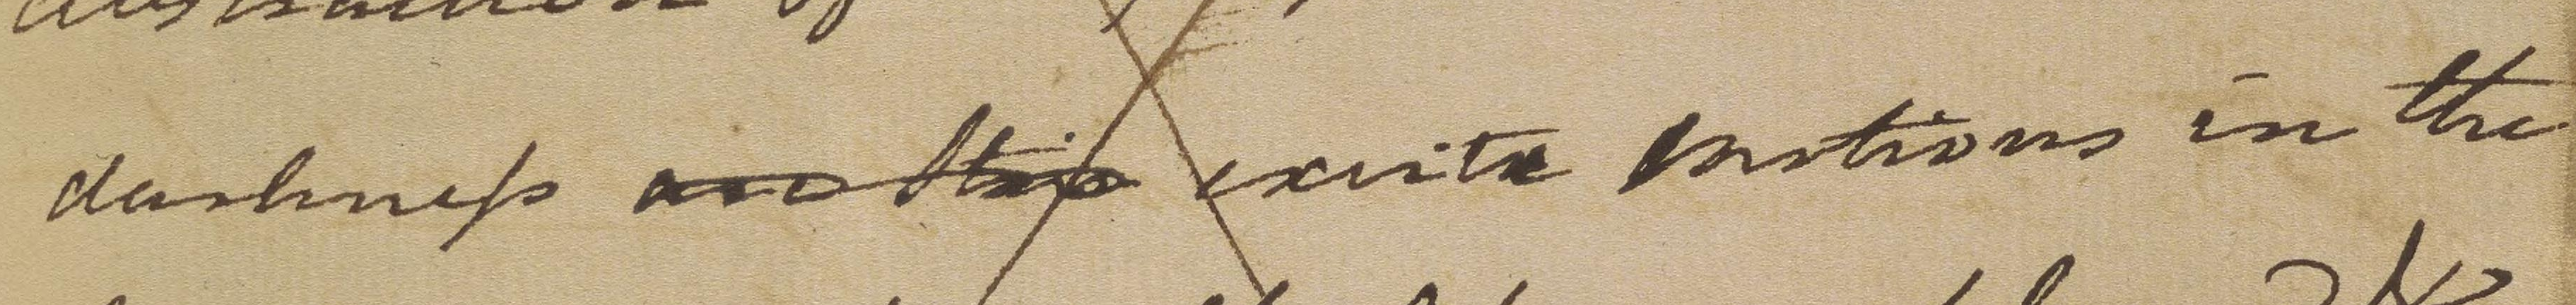darkness [are stir] excite motions in the
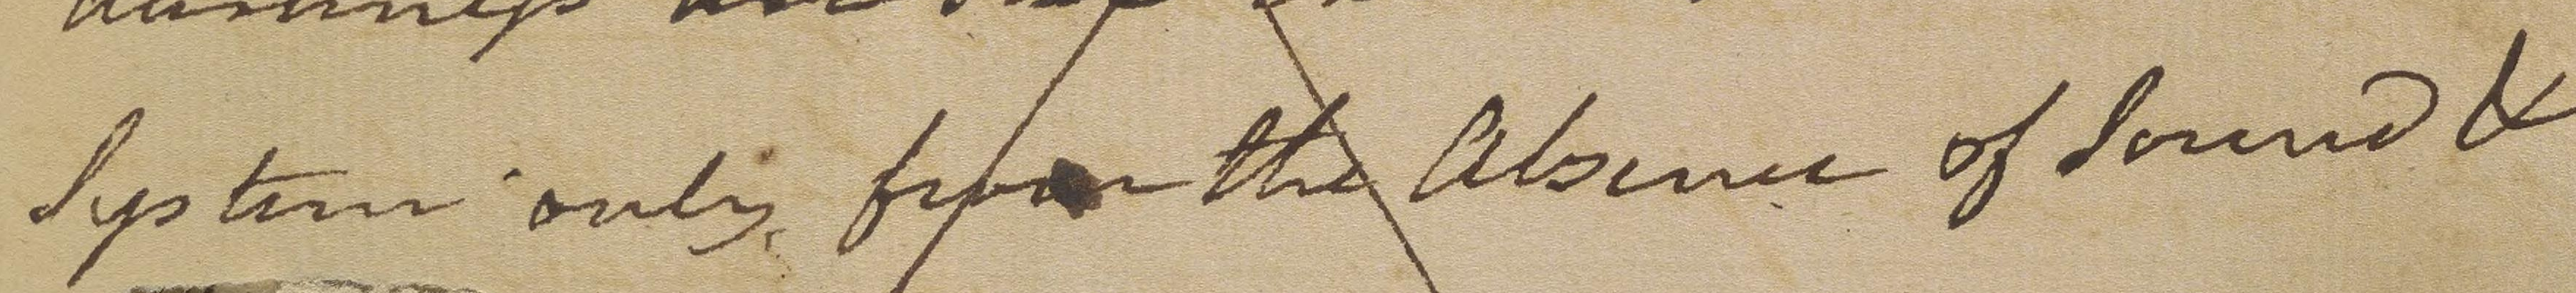System only from the Absence of Sound &
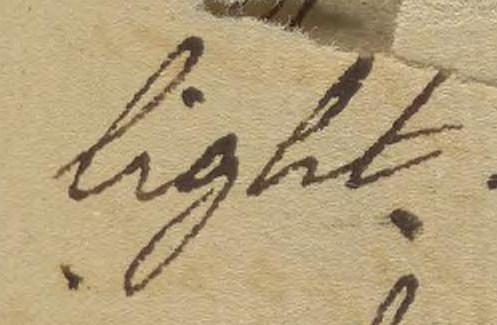light.
